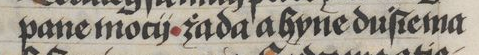pane mocij.żada a hyne duẛie ma
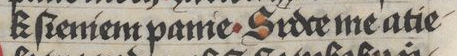k ſieniem panie.Srdce me atie¬
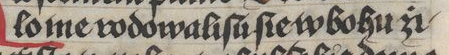lo me rodowaliſu ſie wbohu żi¬
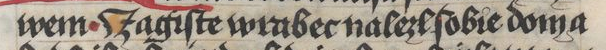wem.Zagiſte wrabec nalezl ſobie dom a
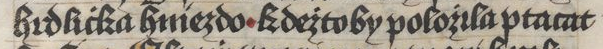hrdliċka hniezdo.kdeżtoby polożila ptacat¬
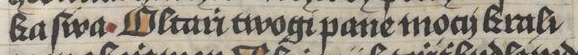ka ſwa.Oltaṙi twogi pane mocij krali
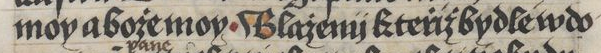moy a boże moy.Blażenij kteṙíż bydlé w do¬
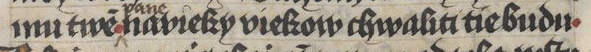mu twē. pane navieky viekow chwaliti tie budu.
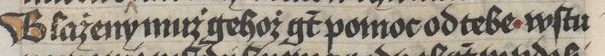Blażeny muż gehoż ḡt pomoc od tebe.wſtu¬
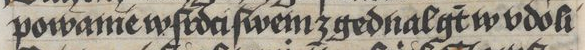powanie wſrdci ſwem z gednal ḡt w vdoli
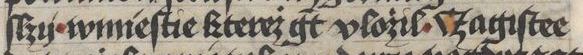ſlzij.wmíeſtie ktereż ḡt vlożil.Zagiſtee
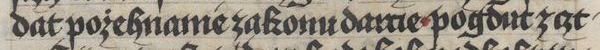dat pożehnanie zakonu darcie.pogdut z czt¬
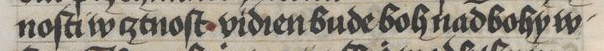noſti w cztnoſt.vidien bude boh nad bohy w
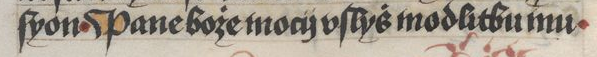ſyon.Panie boże mocij vſlyṡ modlitbu mu.
